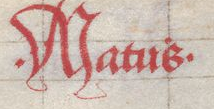.Matuṡ.
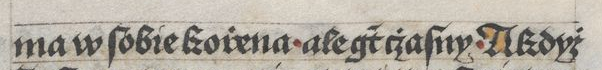ma w ſobie koṙena.ale ḡt cżaſny.A kdyż
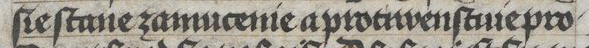ſie ſtane zamuceníe a protiwenſtvíe pro
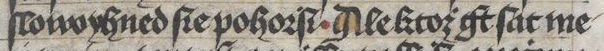ſlowo yhned ſie pohorẛí.Ale ktoż ḡt ſat me¬
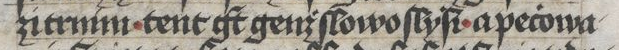zí trním.tent ḡt genż ſlowo ſlyẛi.a peċowa¬
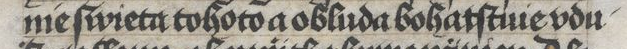níe ſwieta tohoto a obluda bohatſtuíe vdu¬
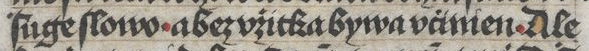ẛuge ſlowo.abez vżitka bywa uċinien.Ale
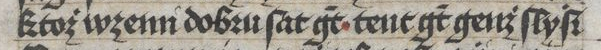ktoż w zemi dobru ſat ḡt.tent ḡt genż ſlyẛí
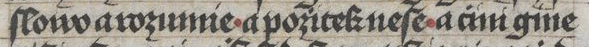ſlowo a rozumie.a pożitek neſe.a ċini gine
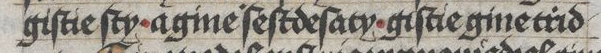giſtie ſty.a gine ſeſtdeſaty.giſtie gine tṙid¬
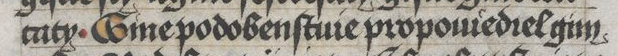caty.Jine podobenſtuíe propouiediel gim
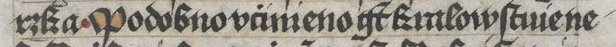rzka.Podobno vċinieno ḡt kralowſtuíe ne¬
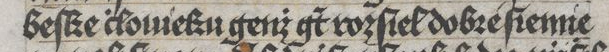beſké ċlouieku genż ḡt rozſiel dobré ſíemie
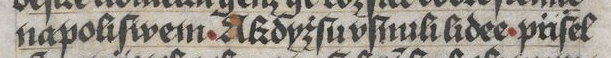napoli ſwem.Akdyż ſu vſnuli lidee.pṙiẛel
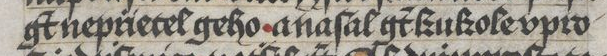ḡt nepṙietel geho.a naſal ḡt kukole vpro¬
